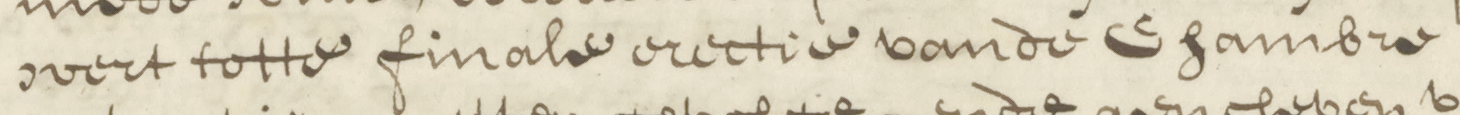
wert totte finale erectie vande Chambre
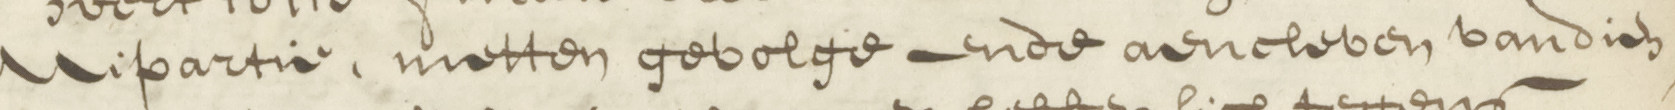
Mipartie, metten gevolge ende aencleven vandien
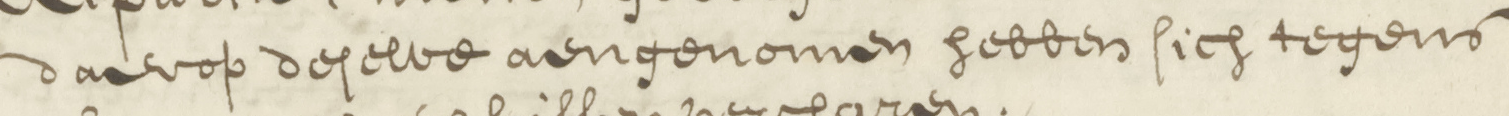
daerop deselve aengenomen hebben sich tegens
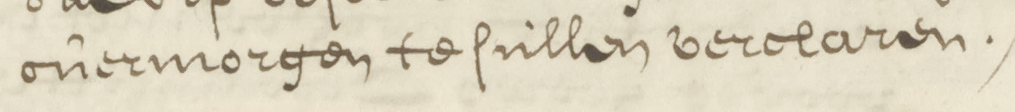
ouermorgen te sullen verclaren.
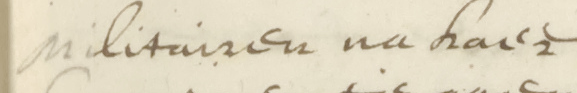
Militairen na haer
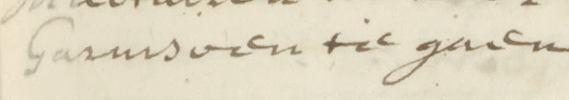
Garnisoen te gaen
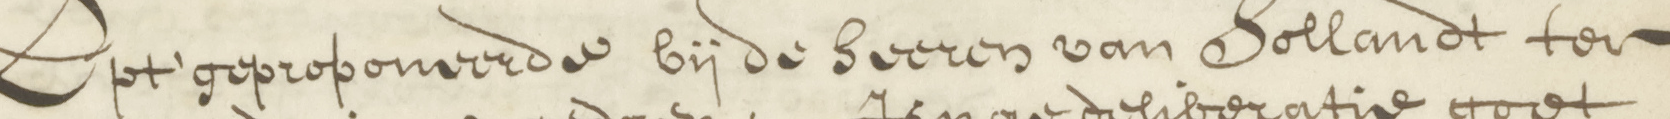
Opt‛ geproponeerde bij de heeren van Hollandt ter
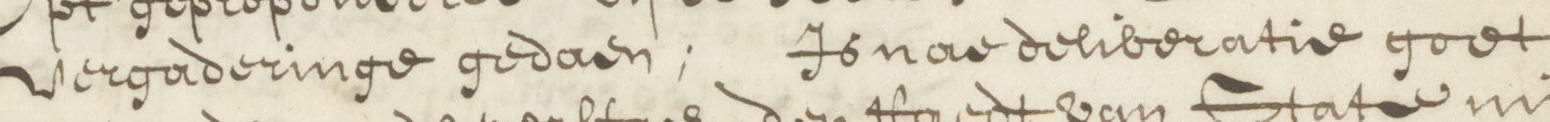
Vergaderinge gedaen; Is nae deliberatie goet
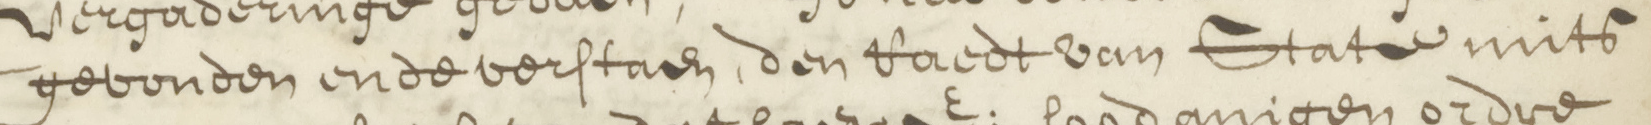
gevonden ende verstaen, den Raedt van State mits
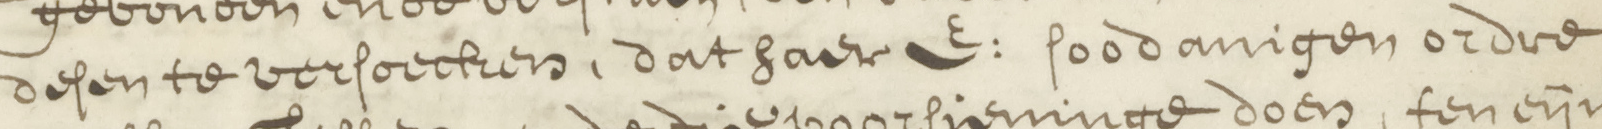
desen te versoecken, dat haer E: soodanigen ordre
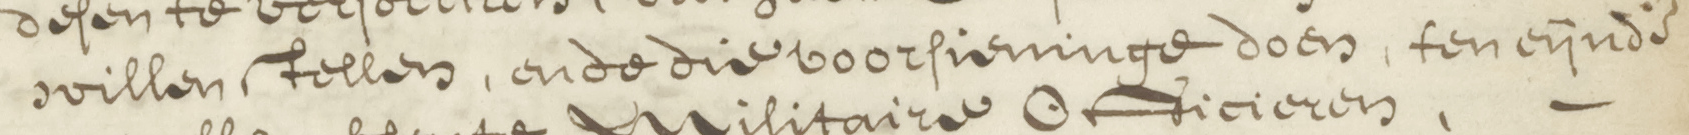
willen stellen, ende die voorsieninge doen ten eijnde
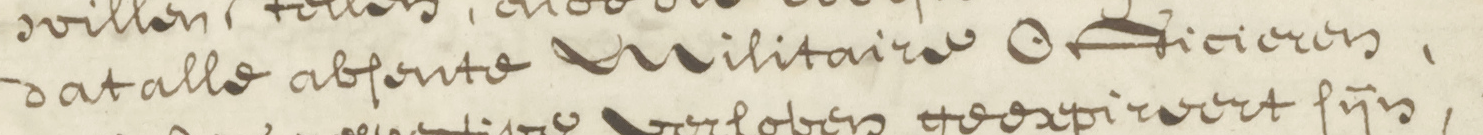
dat alle absente Militaire Officieren,
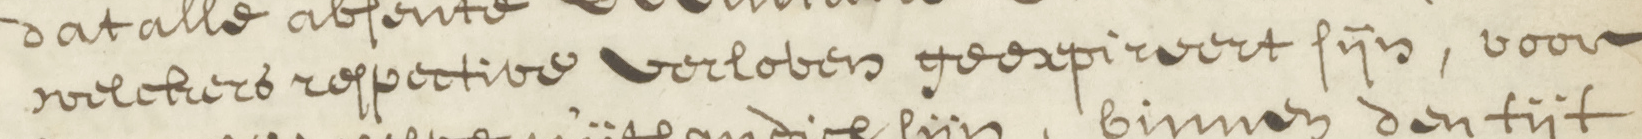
welckers respective verloven geexpireert sijn, voor
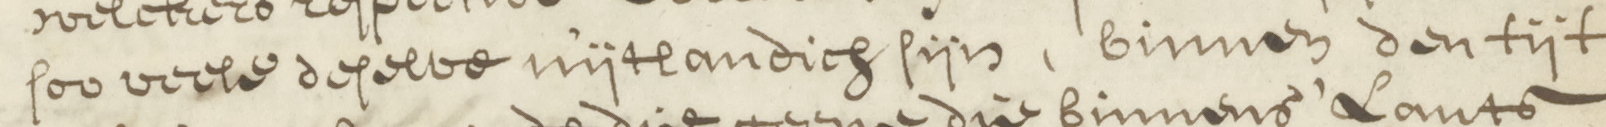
soo veele deselve uijtlandich sijn, binnen den tijt
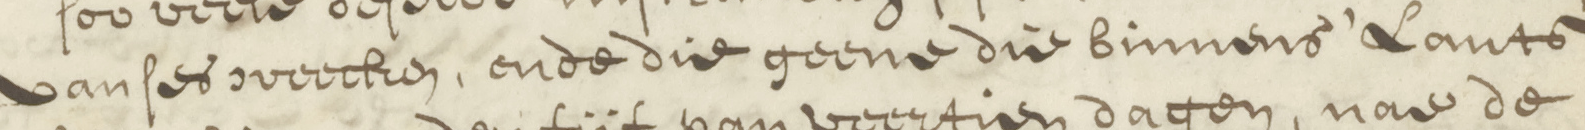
van ses weecken, ende die geene die binnens‛ Lants
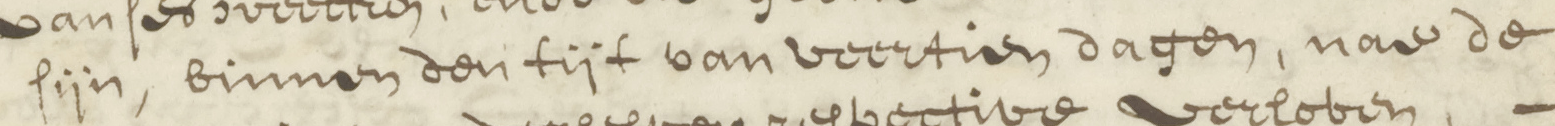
sijn, binnen den tijt van veertien dagen, nae de
